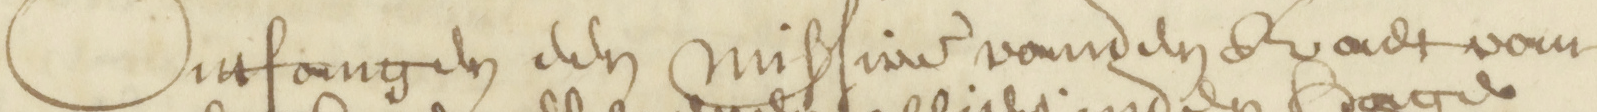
Ontfangen een missive vanden Raet van
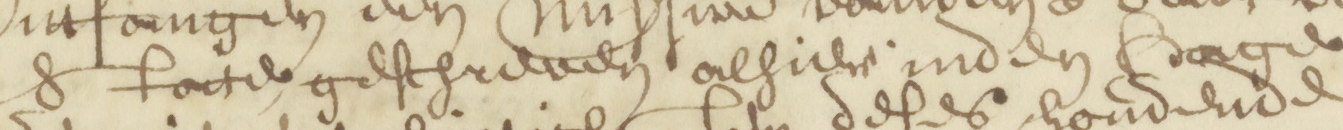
State geschreven alhier inden Hage
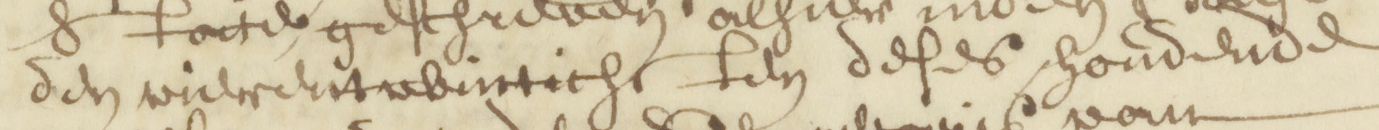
den vierentwintichsten deses, houdende
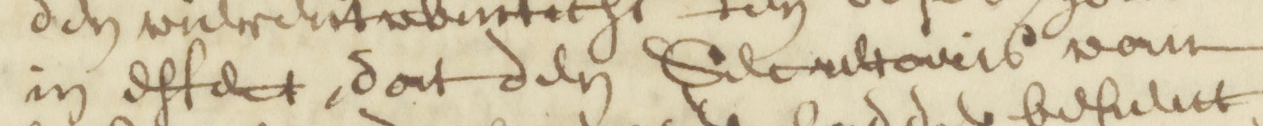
in effect, dat den Secretaris van
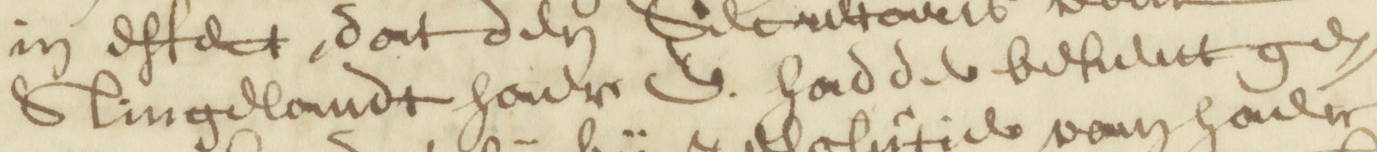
Slingelandt haer E. hadde bekent ge„
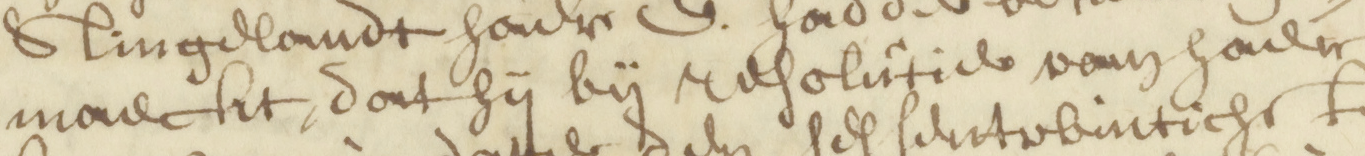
maeckt, dat hij bij resolutie van haer
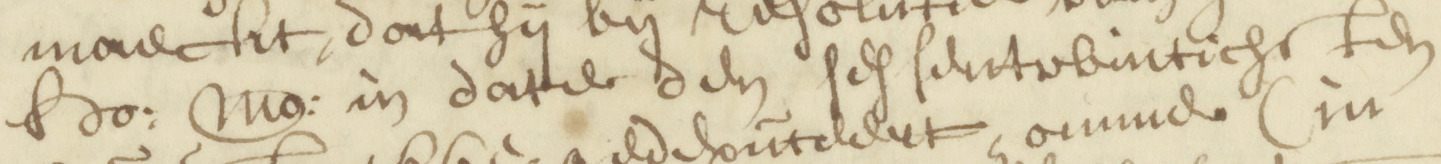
Ho:Mo: in date den sessentwintichsten
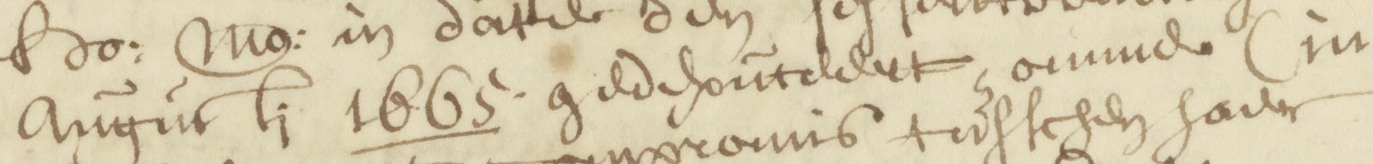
Augusti 1665 gedeputeert omme (in
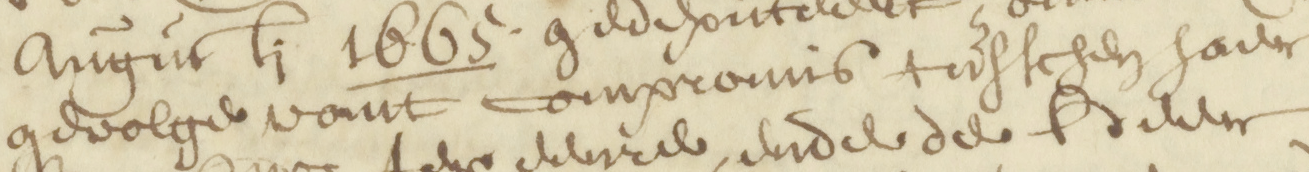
gevolge vant compromis tusschen haer
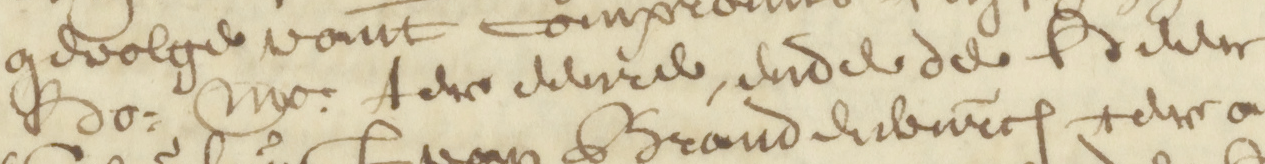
Ho:Mo: ter eenre, ende de Heer
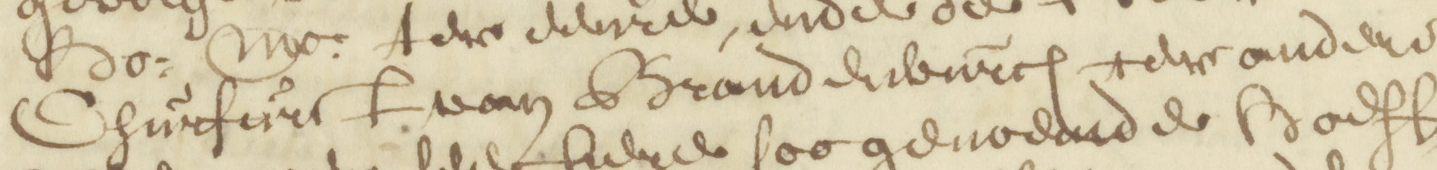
Churfurst van Brandenburch ter andere
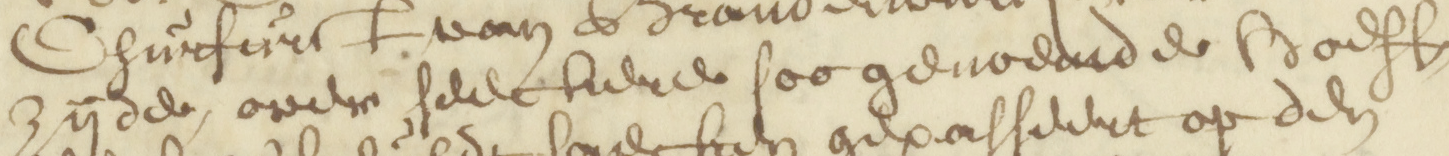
zijde, over seeckere soo genoemde Hoeff„
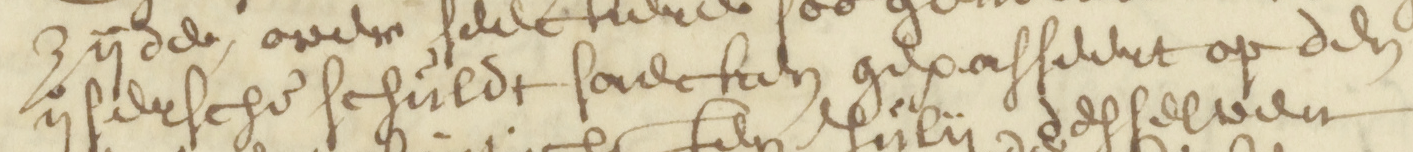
ijsersche schuldt saecken gepasseert op den
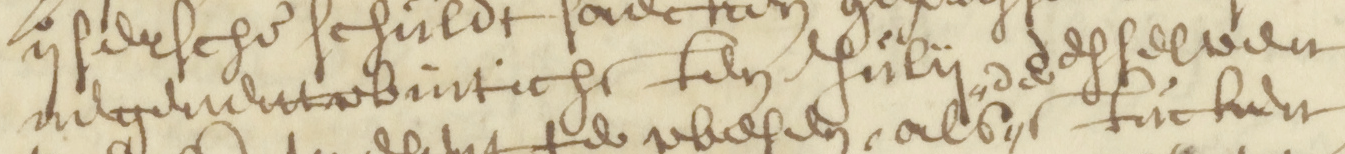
negenentwintichsten Julij desselven
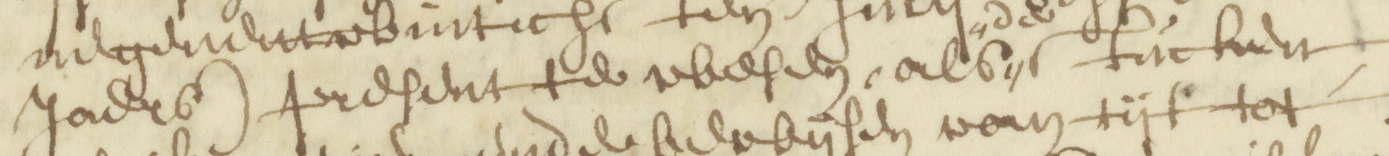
Jaers) present te wesen, als#de stucken
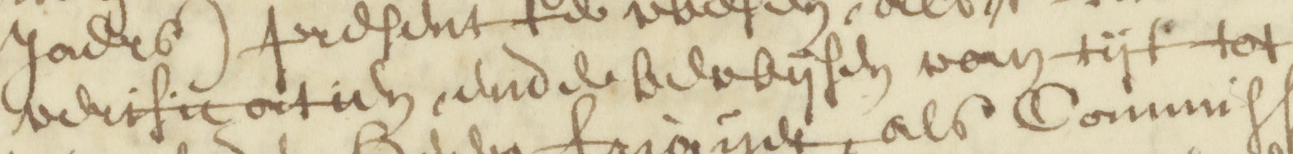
verificatien, ende bewijsen van tijt tot
